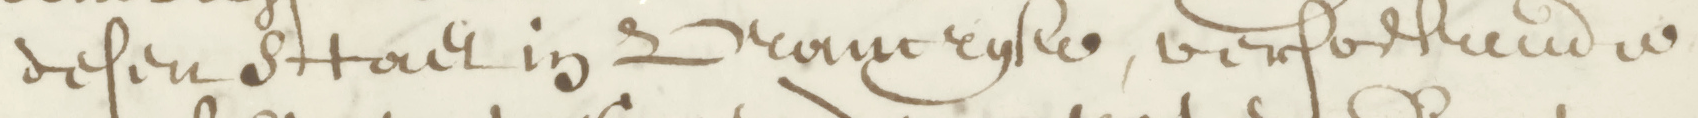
desen Staet in Vrancrijk, versoekende
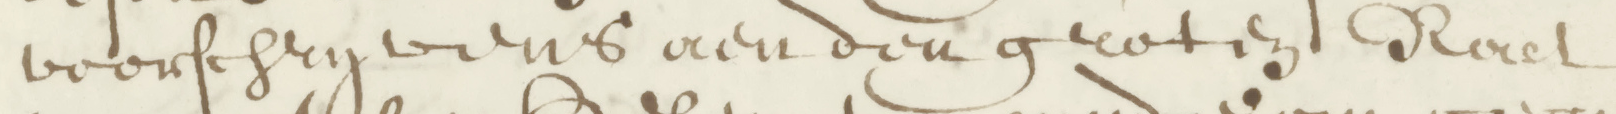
voorschrijvens aen den groten Raet
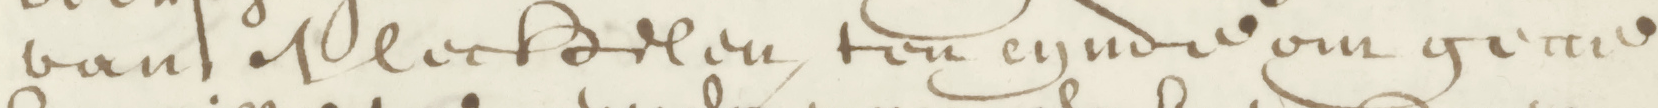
van Mechelen, ten eijnde om gene
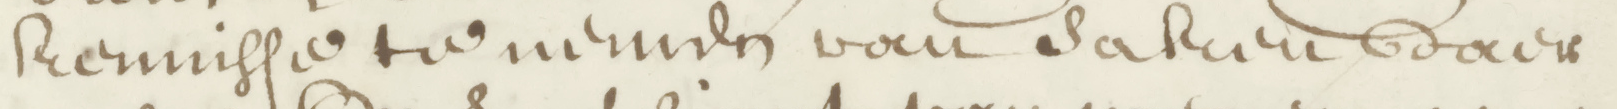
kennisse te nemen van Saken daer
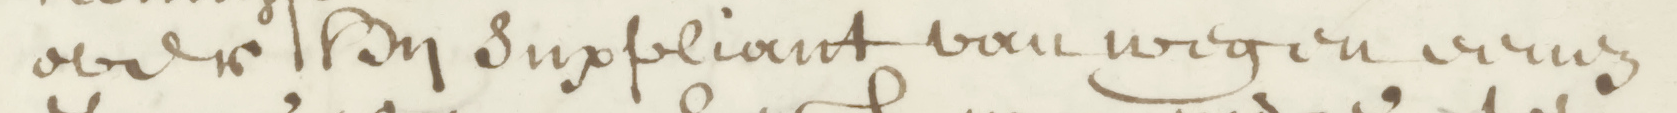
over hij suppliant van wegen eene
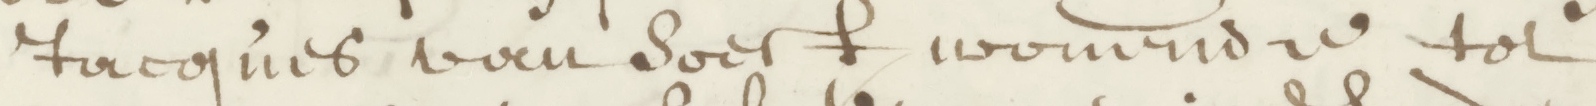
Jacques van Soest wonende tot
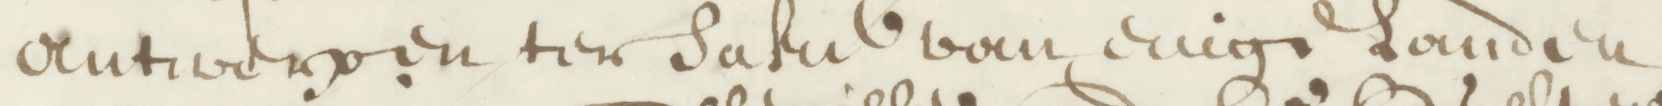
Antwerpen ter sake van enige landen
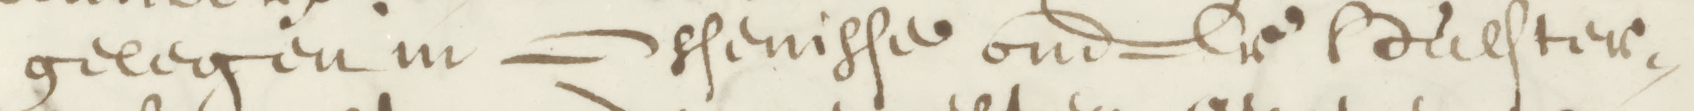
gelegen in Ossenisse onder Hulster„
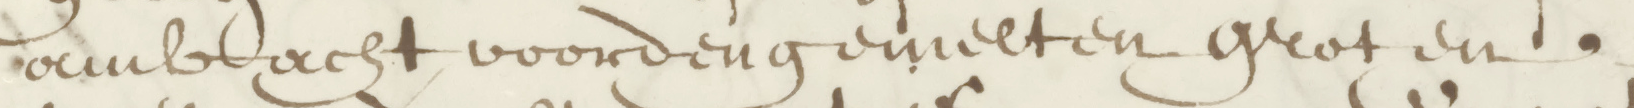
ambacht voorden gemelten groten
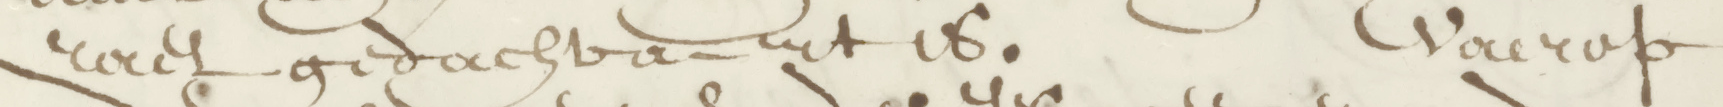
raet gedachvaert is. Waerop
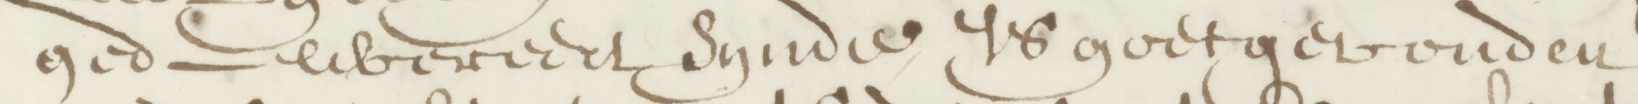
gedelibereert sijnde, is goetgevonden
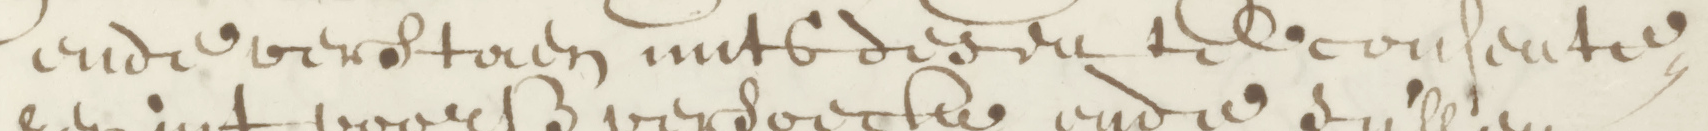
ende verstaen mits desen te consente„
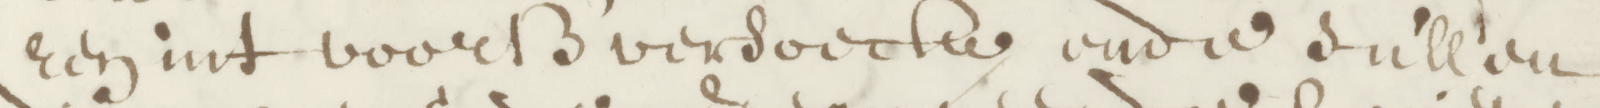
ren int voors versoeck ende sullen
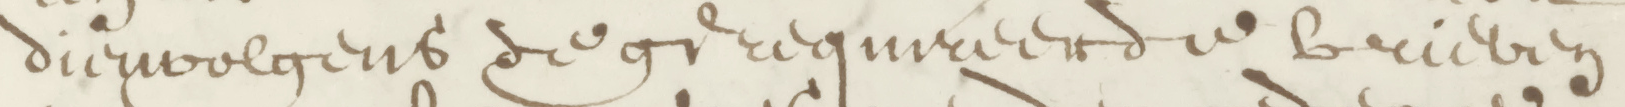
dienvolgens de gerequireerde brieven
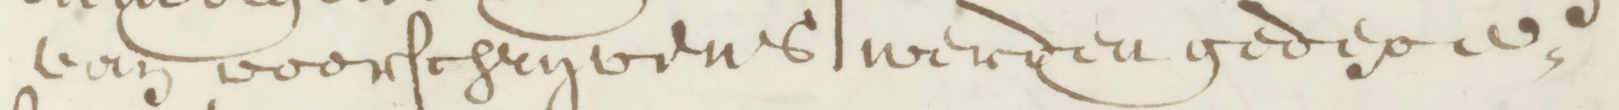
van voorschrijvens werden gedepe„
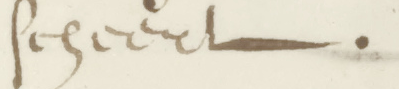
scheert.
